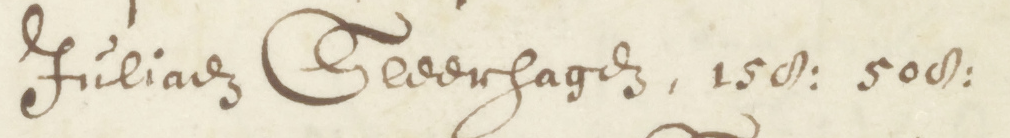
Juliaen Cleerhagen, 158: 508:
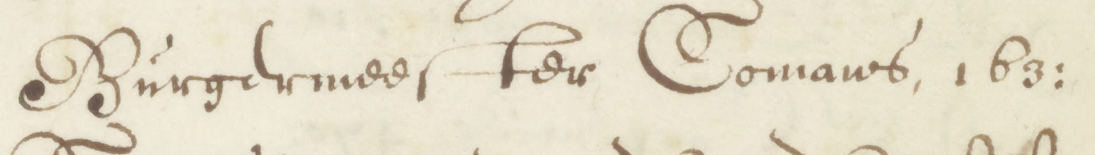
Burgermeester Comans 163:
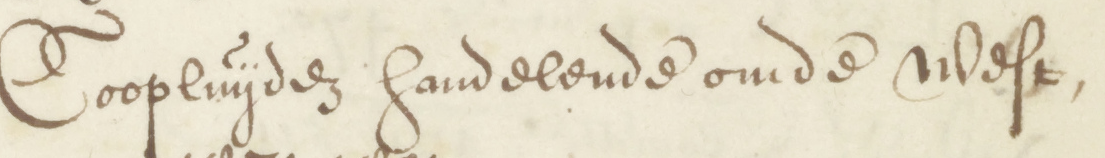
Coopluijden handelende omde West,
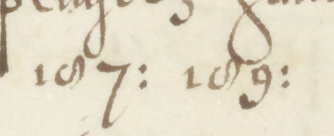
187: 189:
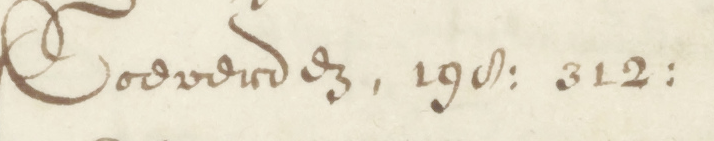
Coeverden, 198: 312:
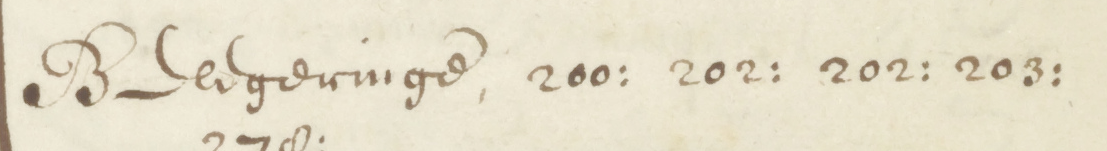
Belegeringe, 200: 202: 202: 203:
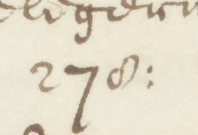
278:
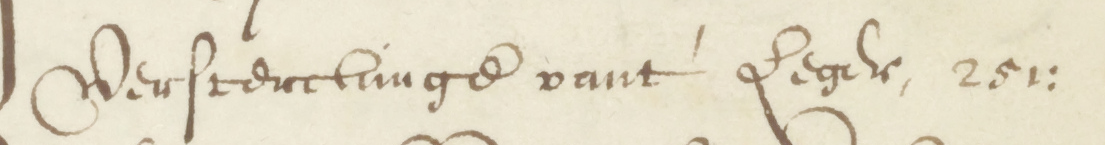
Versterckinge vant‛ Leger, 251:
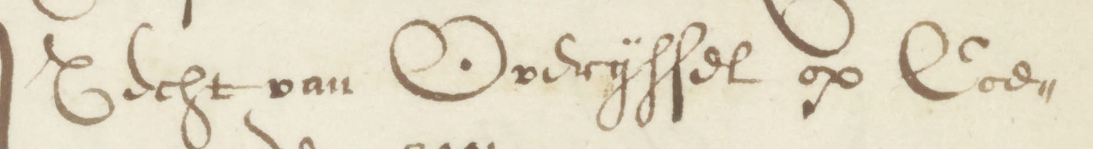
Recht van Overijssel op Coe„
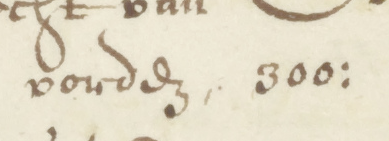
vorden, 300:
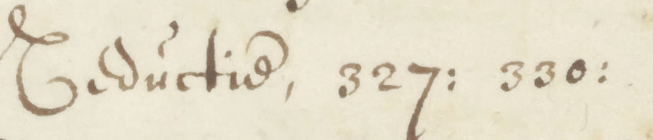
Reductie, 327: 330:
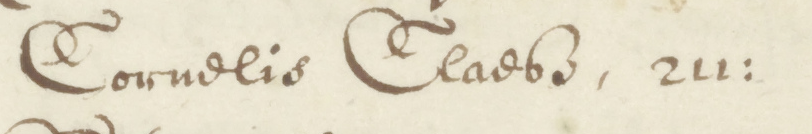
Cornelis Claesz, 211:
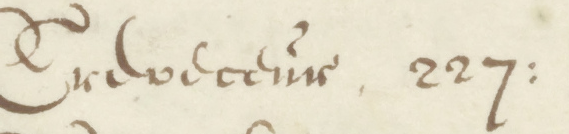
Creveceur, 227:
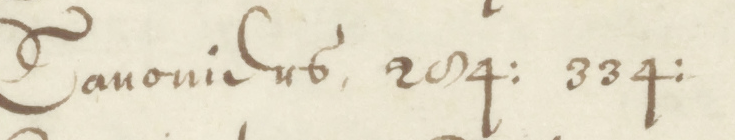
Canoniers, 284: 334:
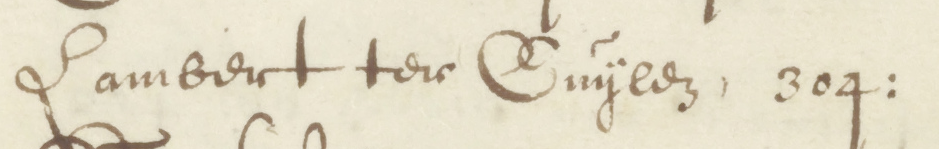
Lambert ter Cuijlen, 304:
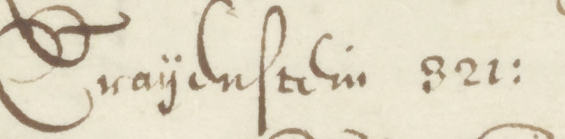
Craijenstein 321:
